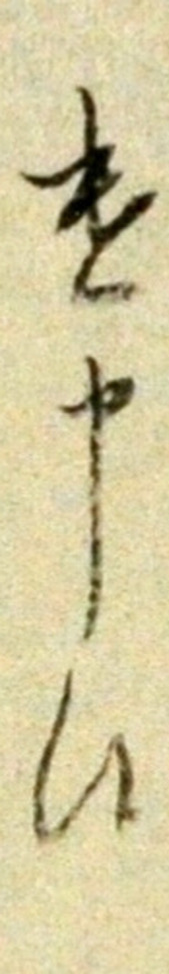遣申候
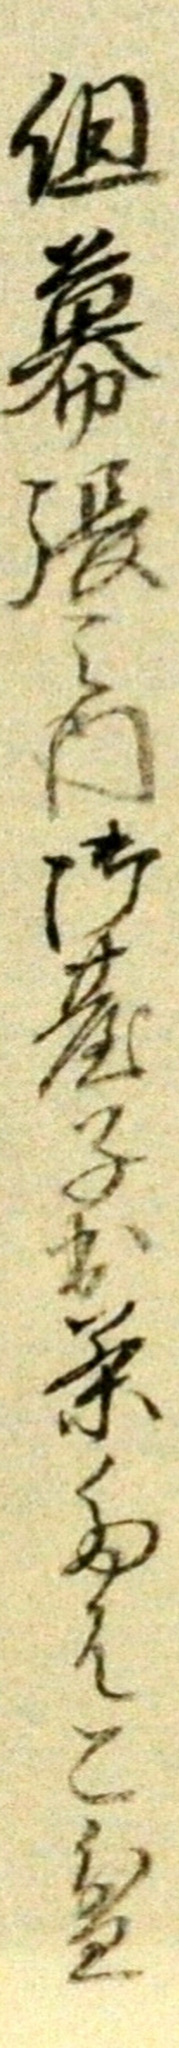但幕張之内御台子出菓たはこ盆
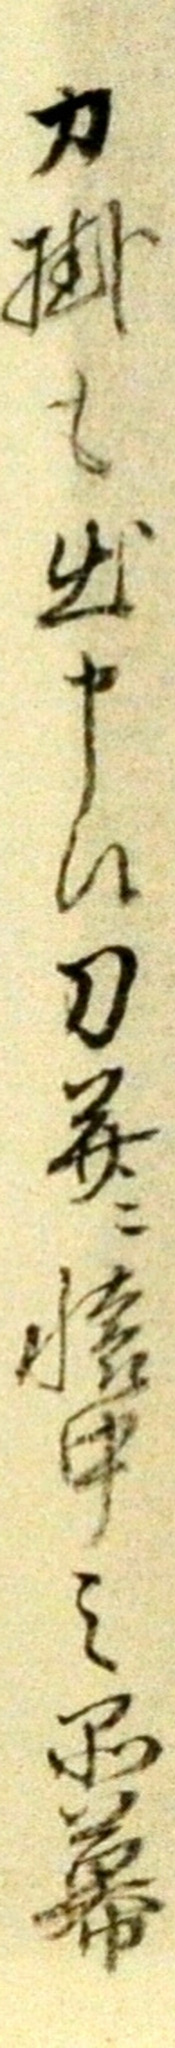刀掛も出申候刀并に懐中之品幕
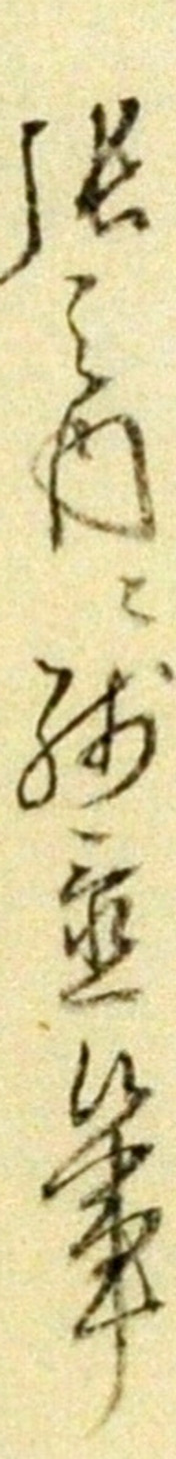張之内に残置候事

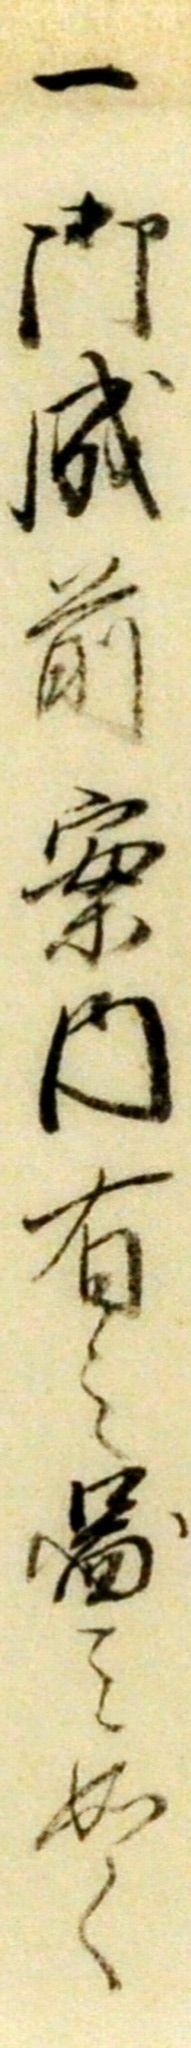一御城前案内有之図之如く
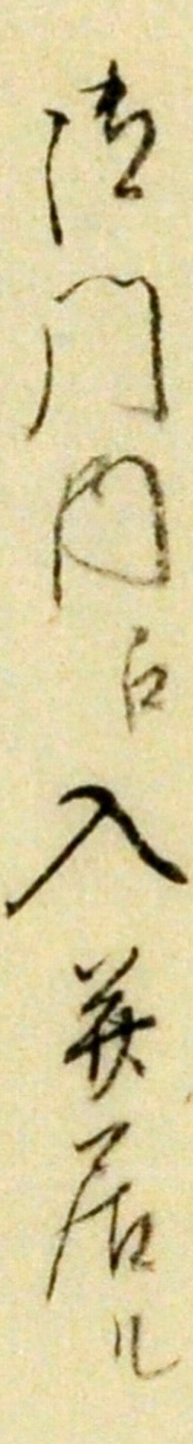御門内え入并居ル
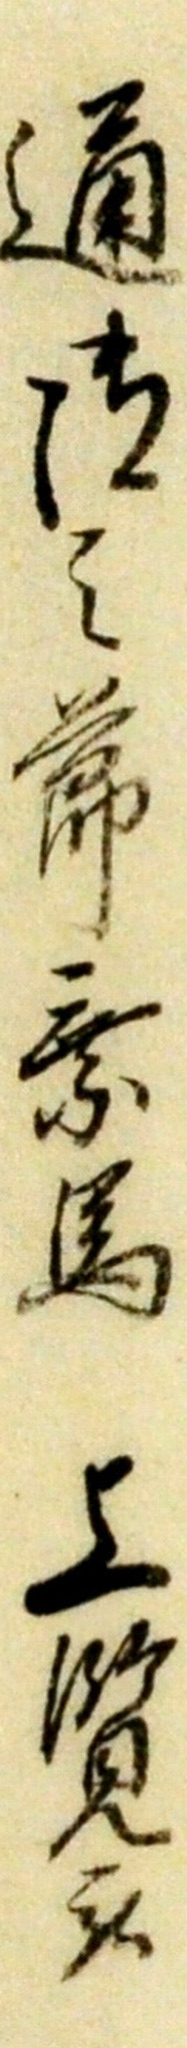通御之節乗馬上覧被
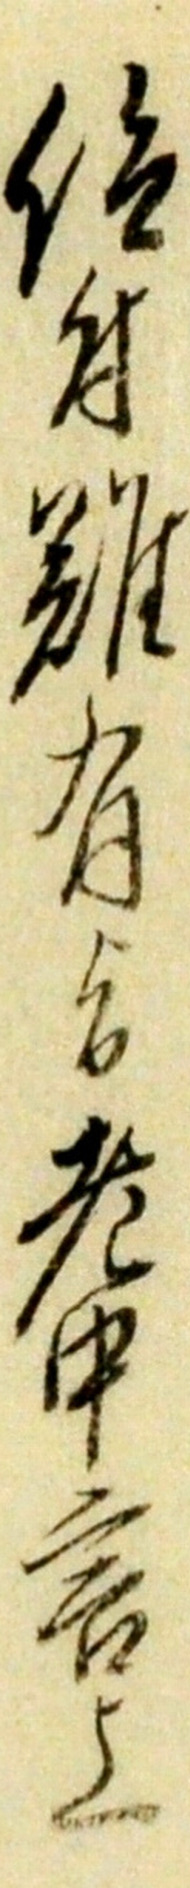仰付難有旨老中言上
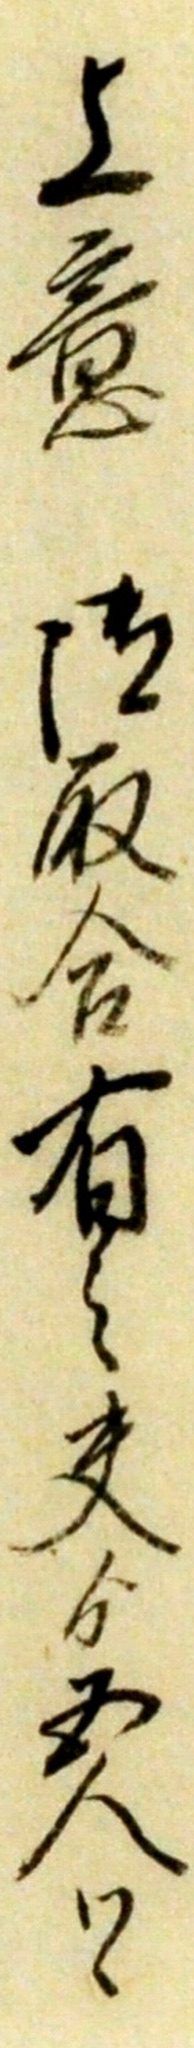上意御取合有之夫ゟ五人ツヽ
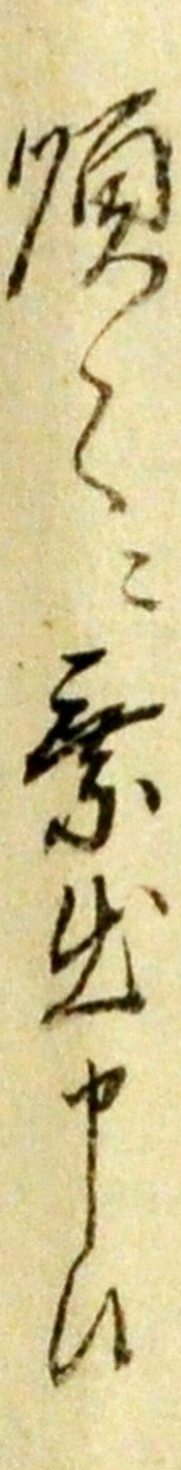順々に乗出申候
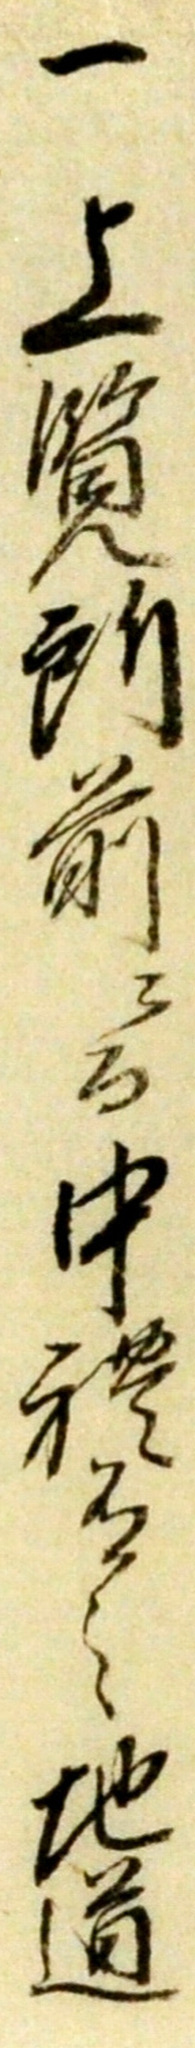一上覧所前に而中礼有之地道
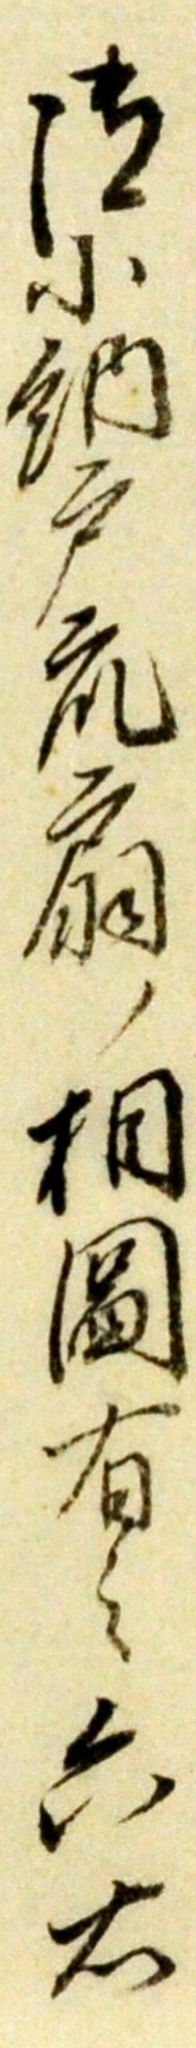御小納戸衆扇ノ相図有之六右
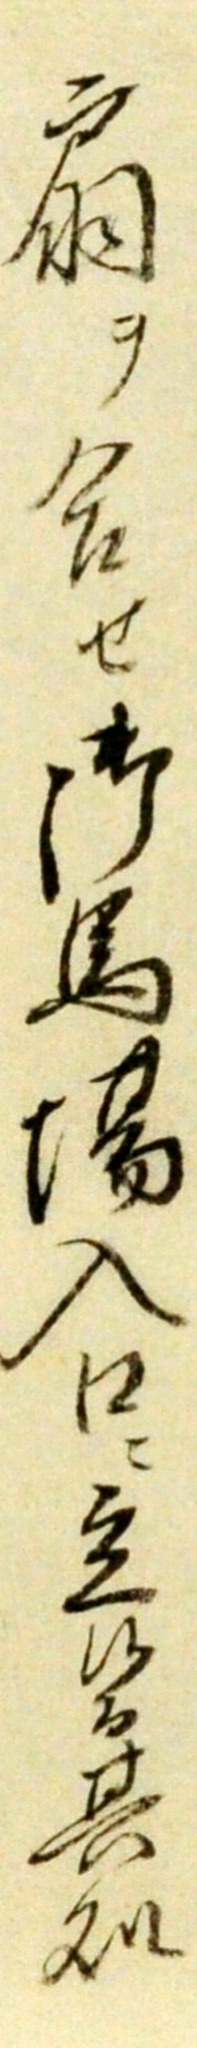扇ヲ合せ御馬場入口に立候而其処

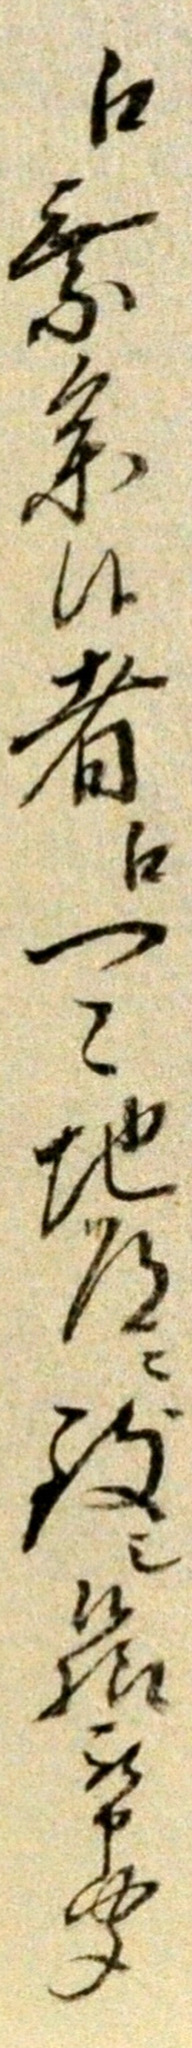え乗参候者え一々地道に致シ候様被申聞
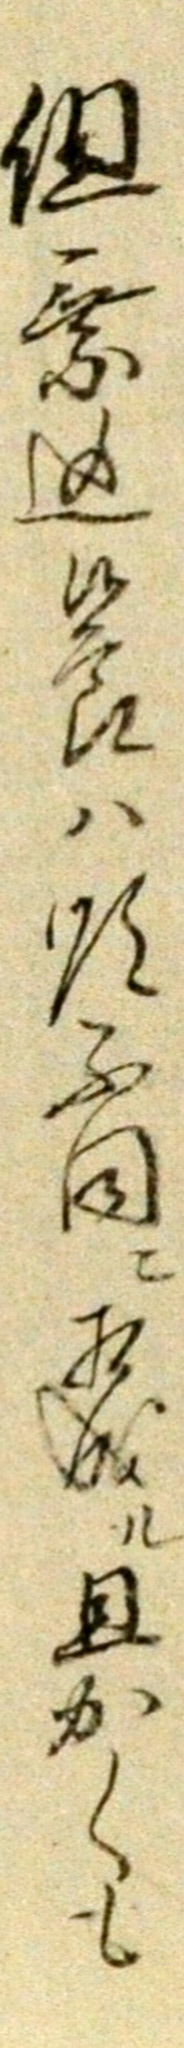但乗込候節は順不同に相成ル且かくも
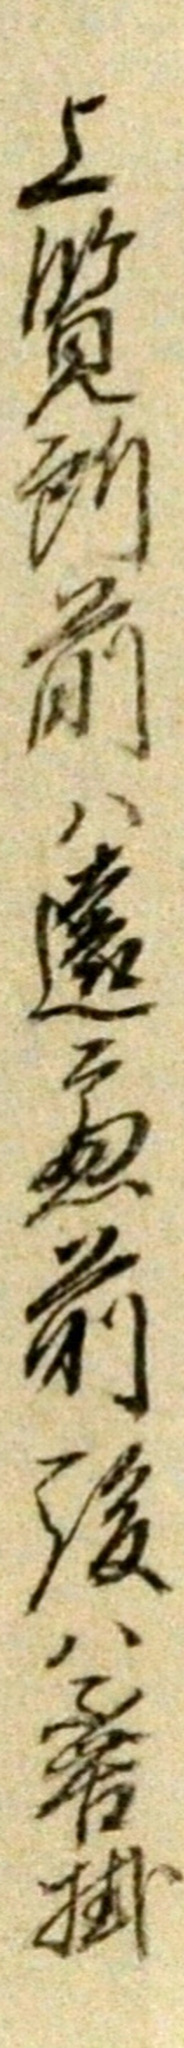上覧所前は遠慮前後は不苦掛
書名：吹上御庭ニ於テ乗馬上覧ノ節留書外
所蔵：伊那市立高遠町図書館・合同会社AMANE
